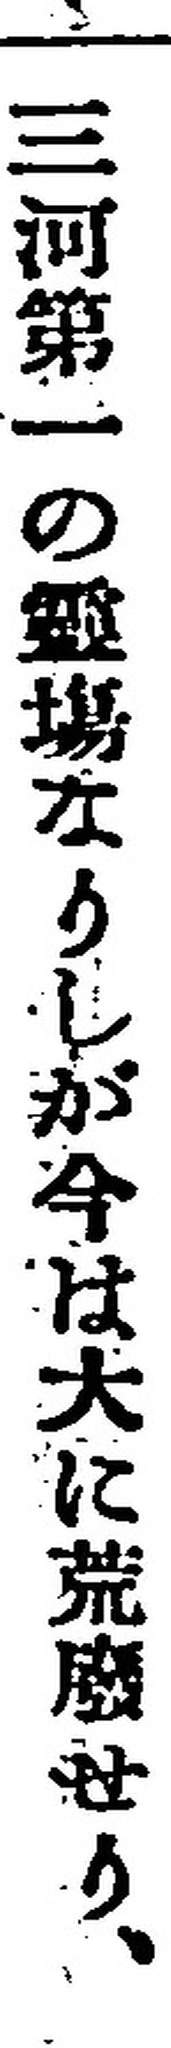三河第一の霊場なりしが今は大に荒廃せり、
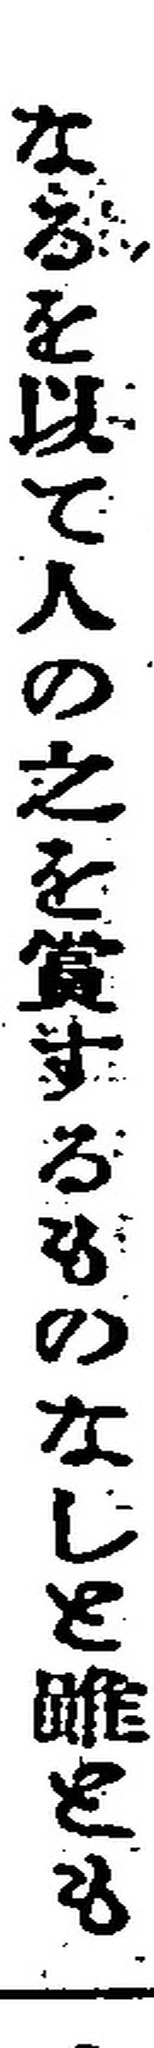なるを以て人の之を賞するものなしと雖とも
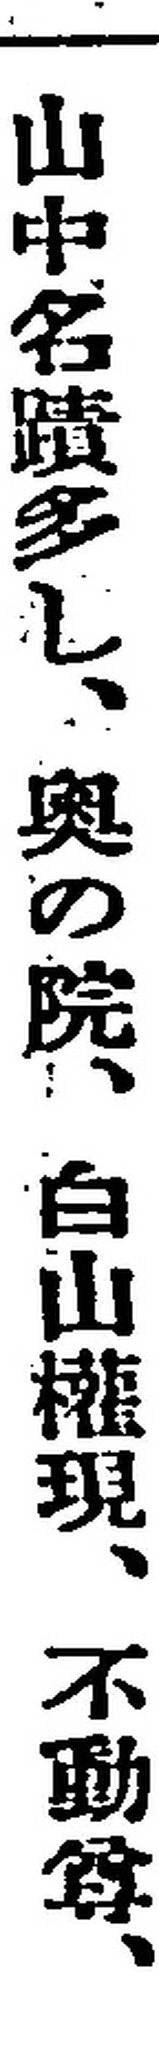山中名蹟多し、奥の院、白山権現、不動尊、
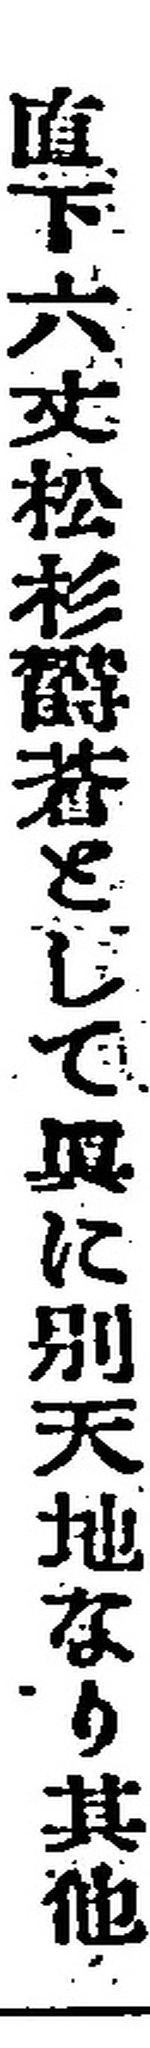直下六丈松杉鬱蒼として真に別天地なり其他
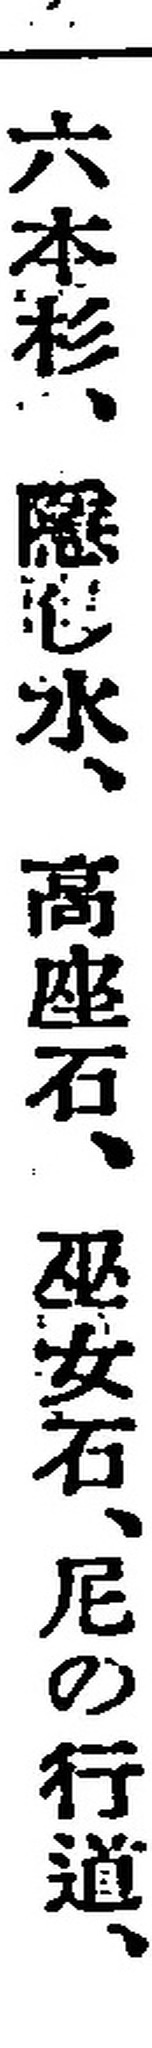六本杉、隠し水、高座石、巫女石、尼の行道、
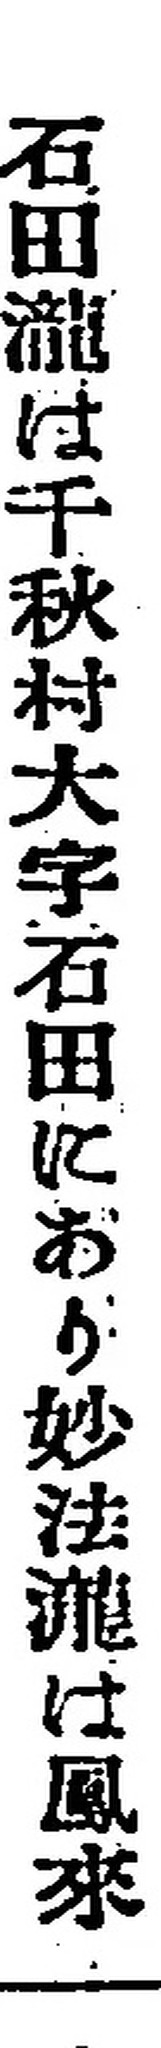石田瀧は千秋村大字石田にあり妙法瀧は鳳来
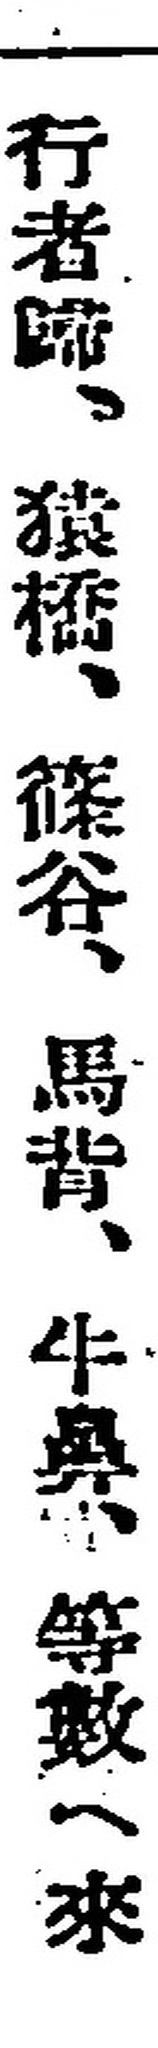行者帰、猿橋、篠谷、馬背、牛鼻、等数へ来
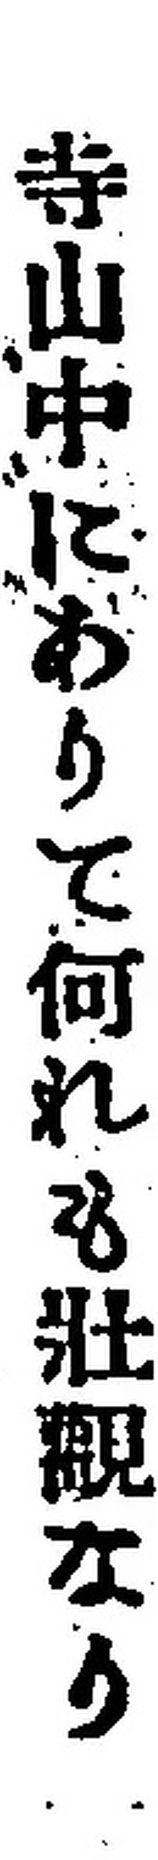寺山中にありて何れも壮観なり
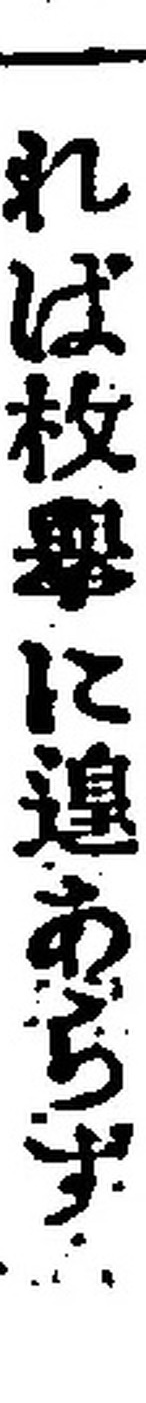れば枚挙に遑あらず
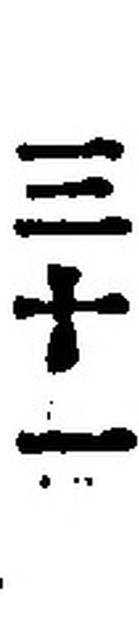三十一

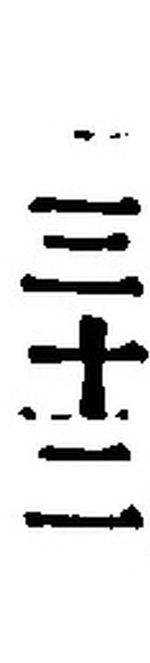三十二
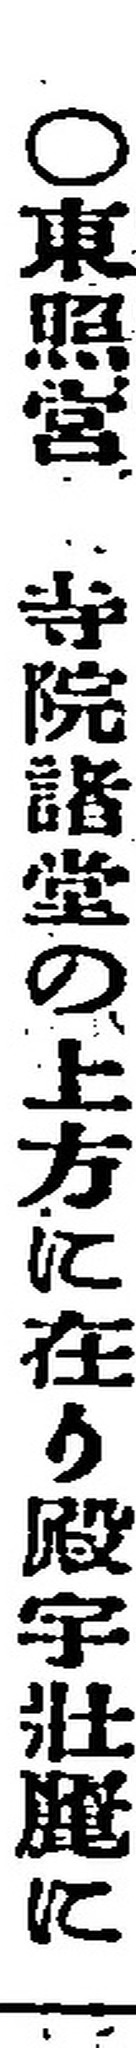○東照宮寺院諸堂の上方に在り殿宇壮麗に
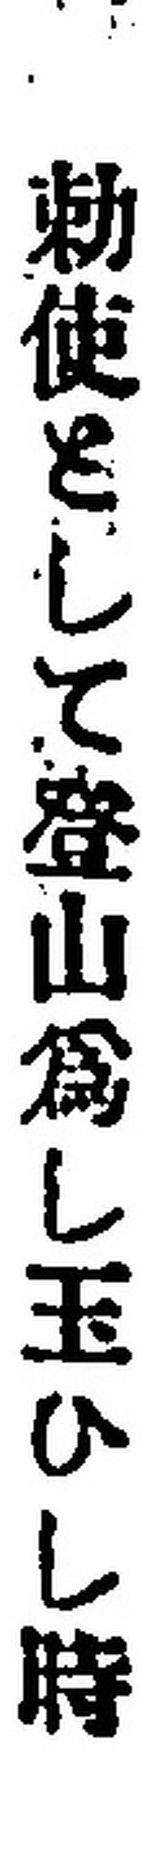勅使として登山為し玉ひし時
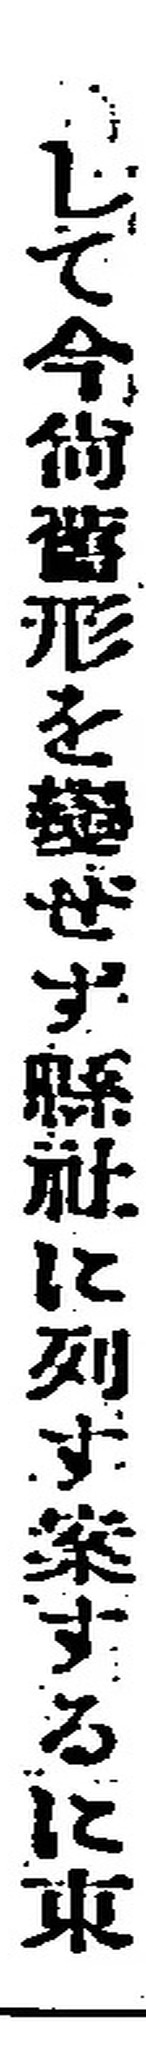して今尚旧形を変ぜず県社に列す案するに東
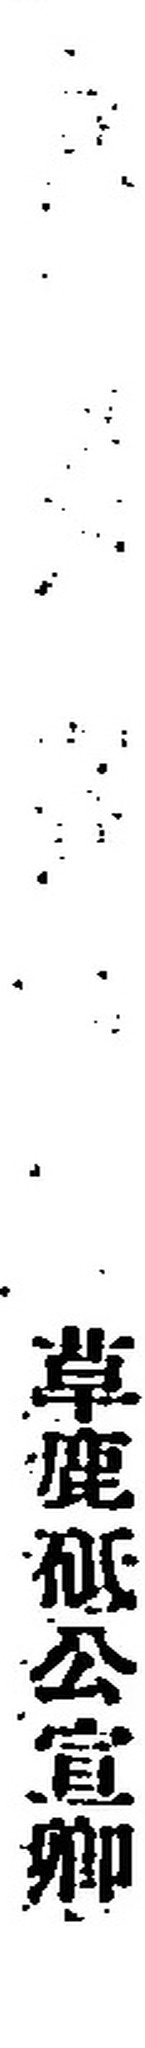草鹿砥公宣卿
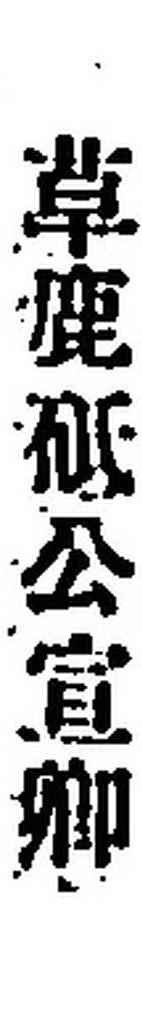草鹿砥公宣卿
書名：東参名勝案内
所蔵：国立国会図書館 National Diet Library, JAPAN
